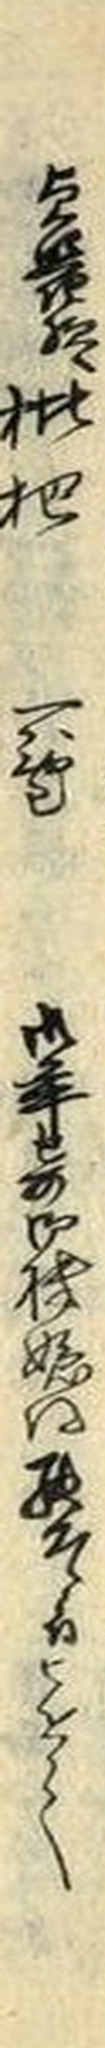貞照院様へ枇杷一台御年寄御機嫌伺罷出候ニ付被進之
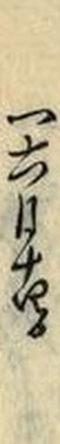一六月十五日
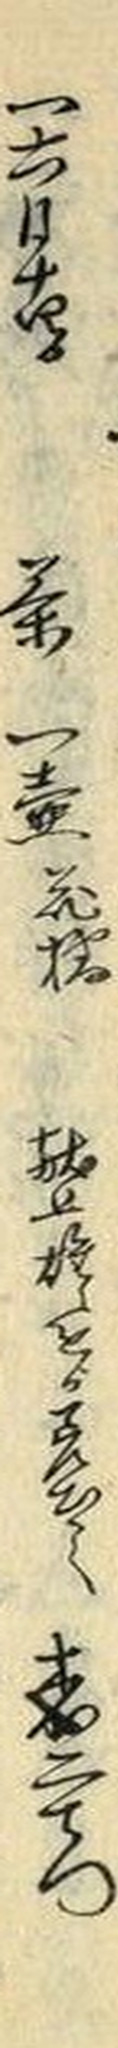一六月十四日茶一壺花橘献上雄之進ゟ差出之森二十右衛門
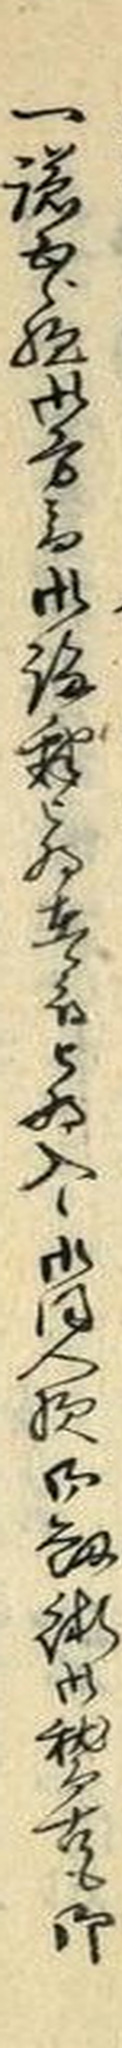一謙五郎様御方ニ而御講釈被為在候ニ付被為入候御同人様御釼術御稽古も御
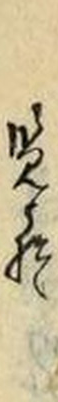覧被遊候
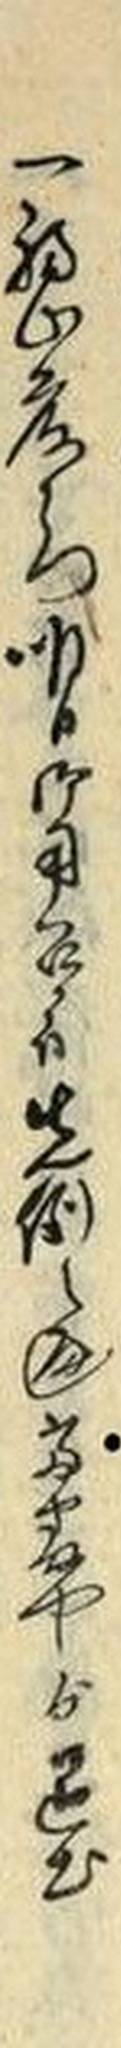一福山藤右衛門昨日御用召ニ付先例之通当番中ゟ退出
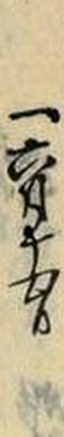一六月十五日

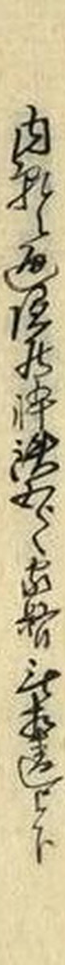内願之通隠居忰鉄五郎へ家督無相違被下
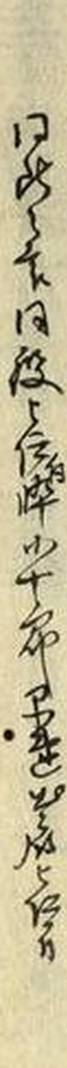御直同断之節同役被仰付忰小十郎早速出府被仰付
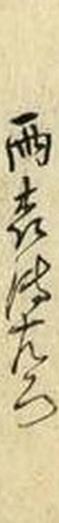雨森伝左衛門
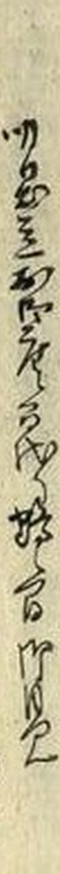明日出立於御座之間代り鶴之間御目見
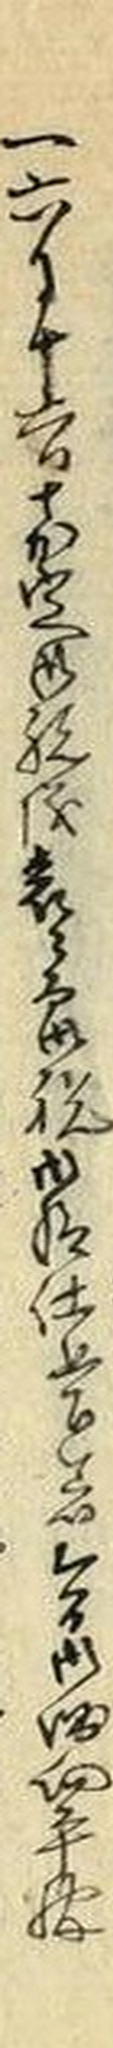一六月十六日嘉定御祝儀表ニ而御祝御給仕上下着今日御側向平服
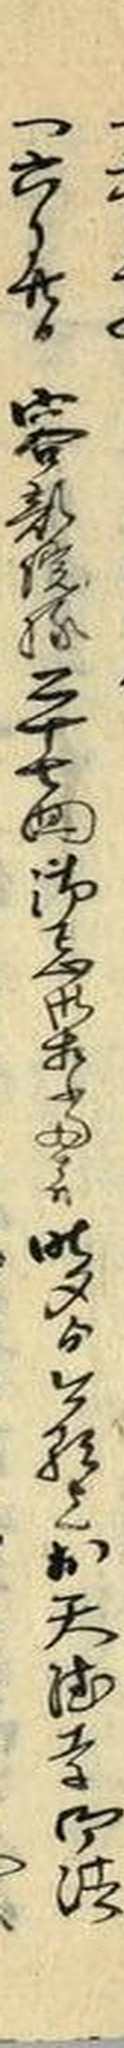一六月廿日容部院様二十七回御忌御相当ニ付昨夕ゟ今朝迄於天徳寺御法
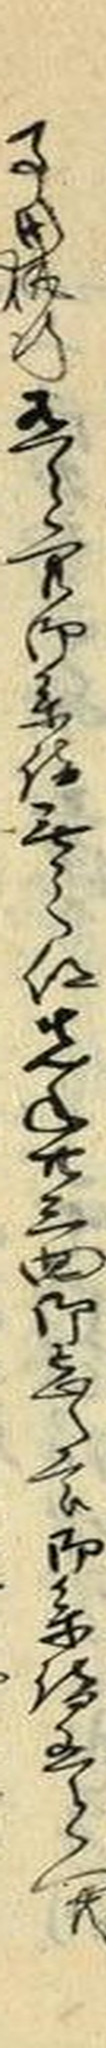事御執行有之候へ共御参詣無之但先年廿三回御忌之節御参詣有之候へ共
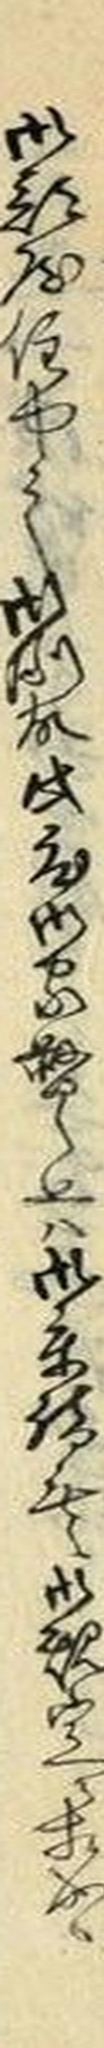御部屋住中之御例故此度御家督之上ハ御参詣無之御規定ニ相成候
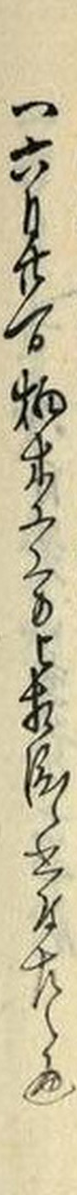一六月廿一日狛木工方被相渡候書付左之通
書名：少傅日録抄（斉承付側向頭取日記、在府）
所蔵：福井県文書館 Fukui Prefectural Archives
